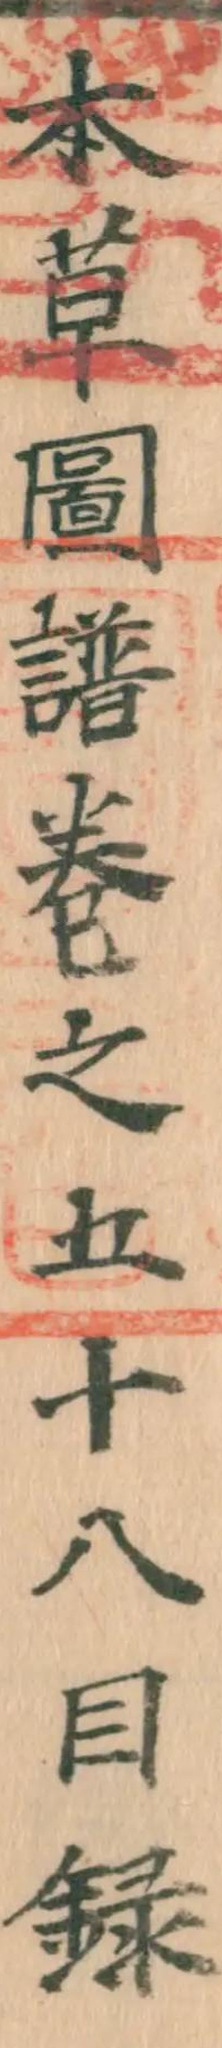本草図譜巻之五十八目録

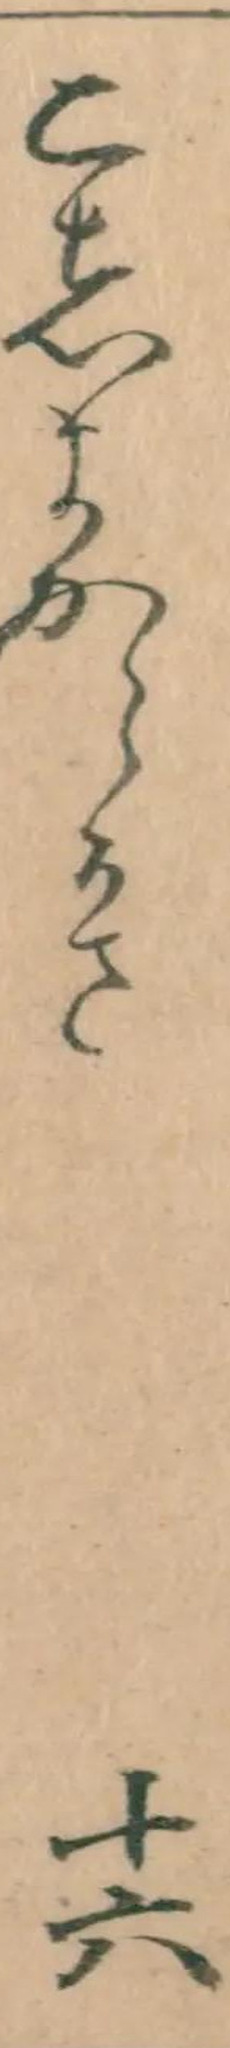同こしよからかさ十六

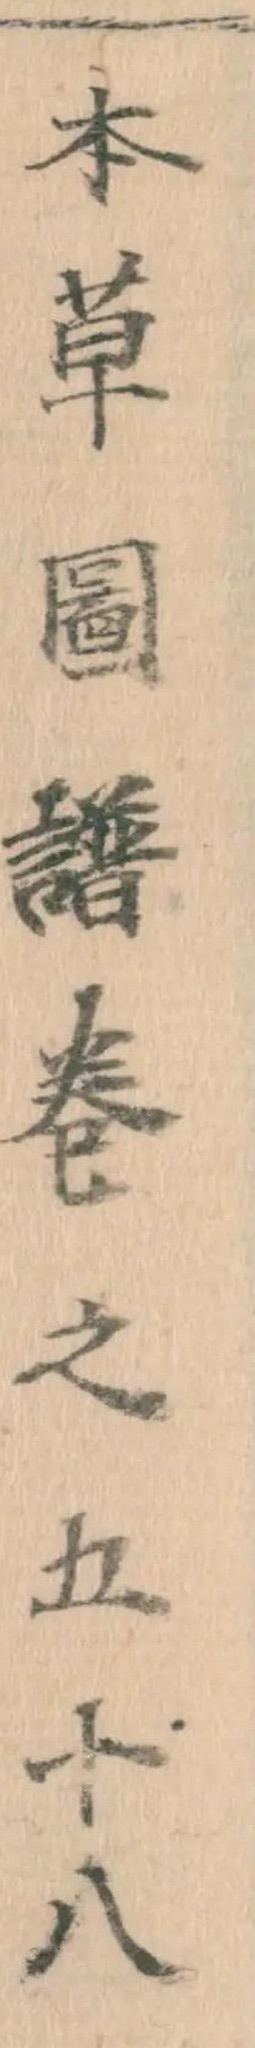本草図譜巻之五十八
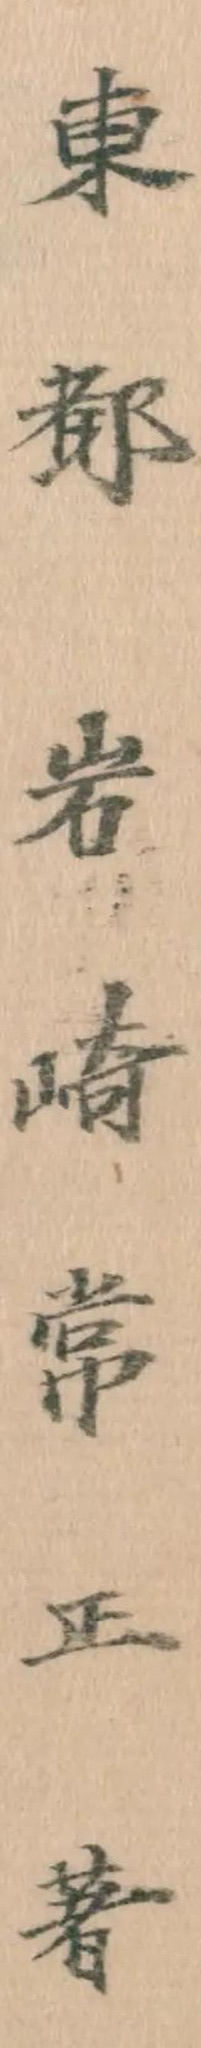東都岩崎常正著
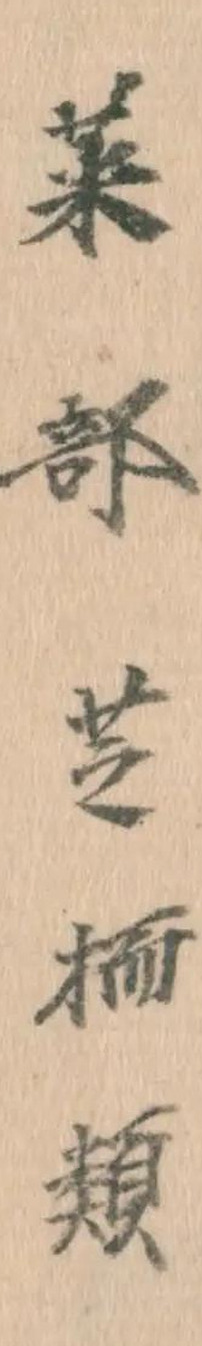菜部芝栭類
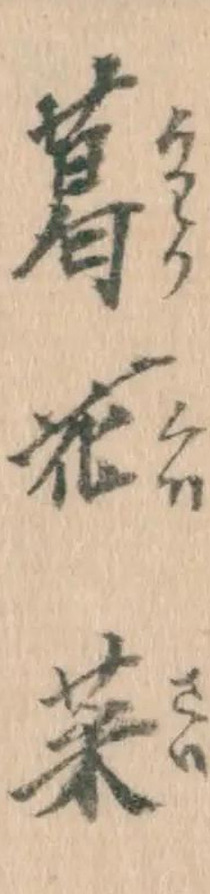葛花菜
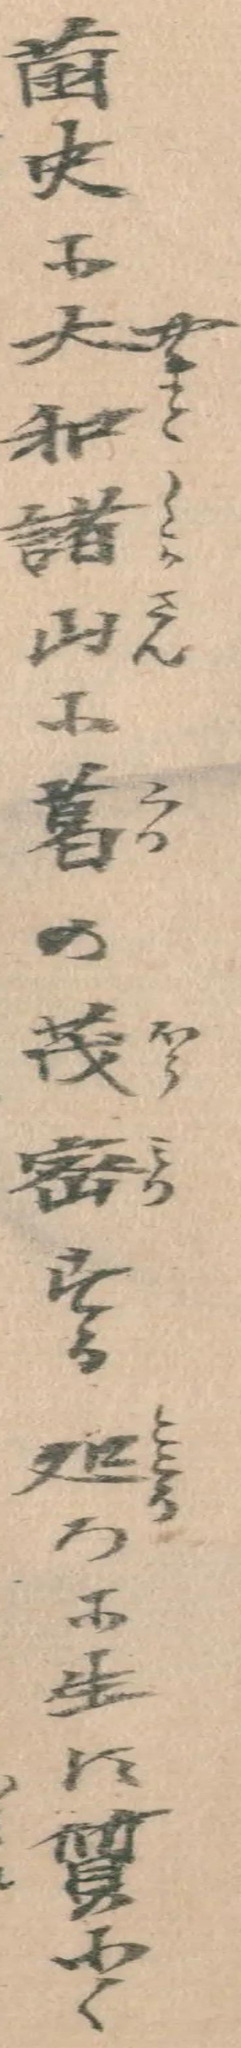菌史に大和諸山に葛の茂密する処ろに生す質にく
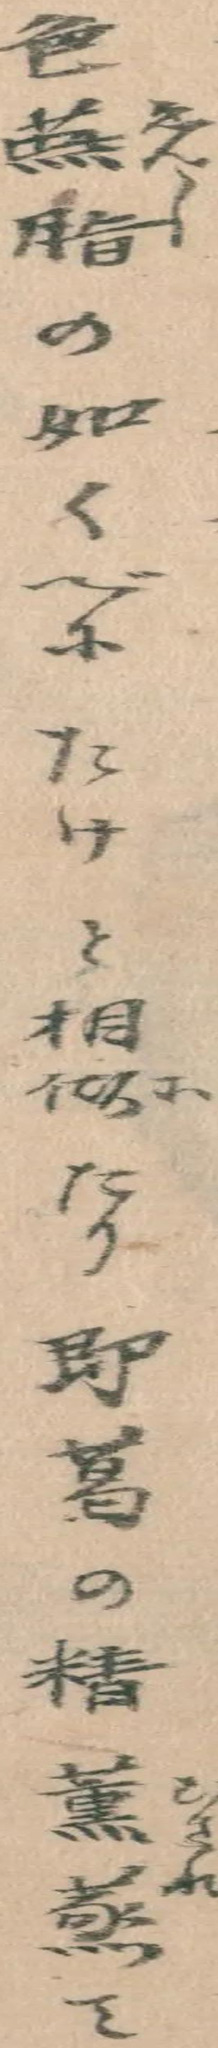色燕脂の如くべにたけと相似たり即葛の精薫蒸て
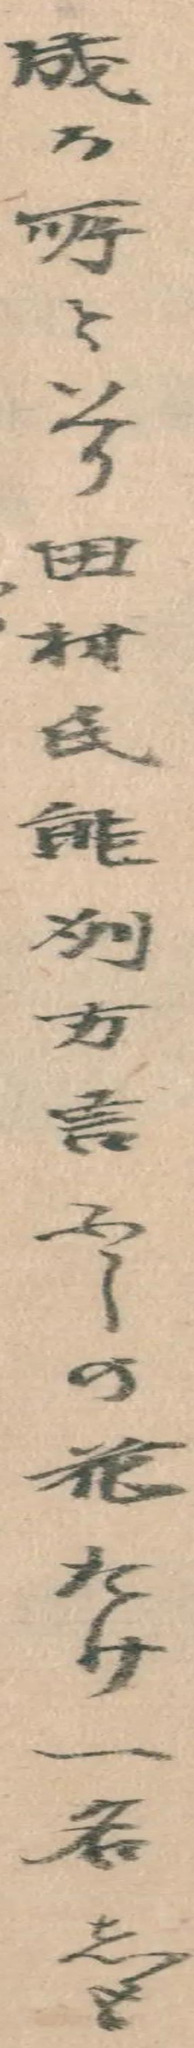成る所といへり田村氏能州方言ふしの花たけ一名しも
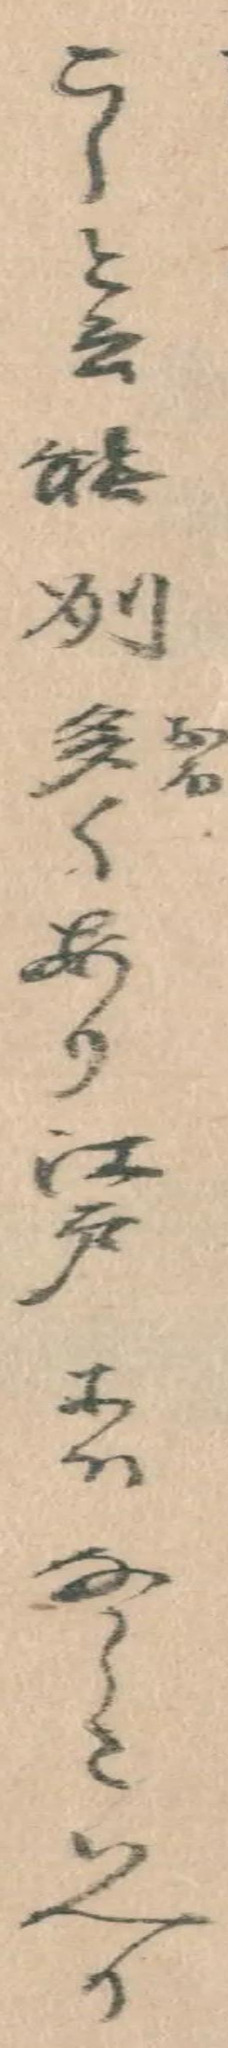こしと云能州多くあり江戸にはなしといへり

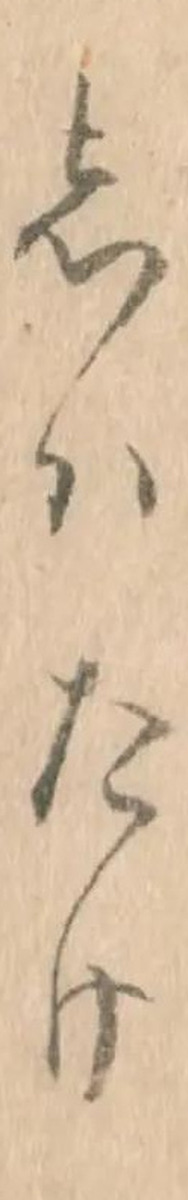しはたけ
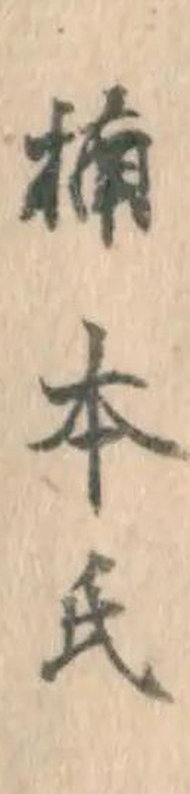楠本氏
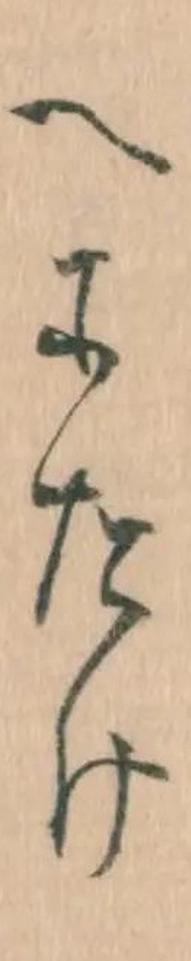へにたけ
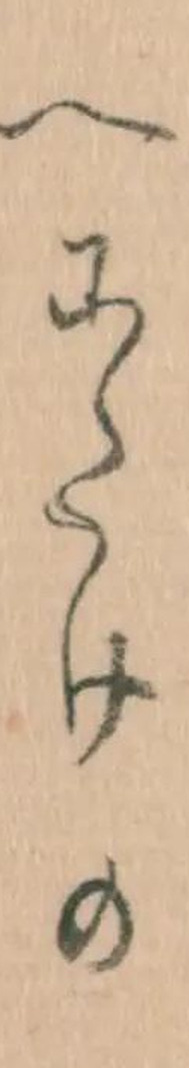へにたけの
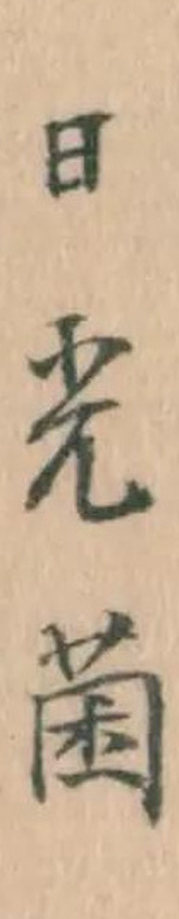日光菌
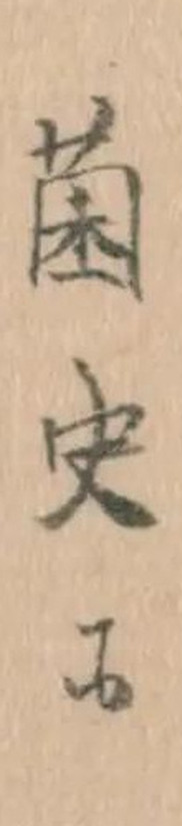菌史に
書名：本草図譜. 巻58-60
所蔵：国立国会図書館 National Diet Library, JAPAN
